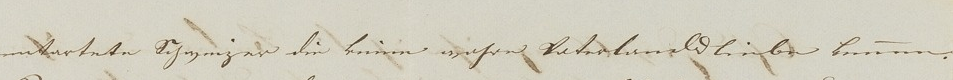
entartete Schweizer die keine wahre Vaterlandsliebe kennen.
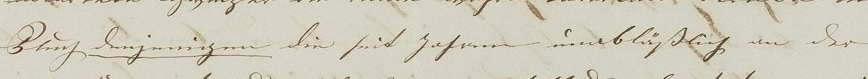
Fluch denjenigen die seit Jahren unabläßlich an der
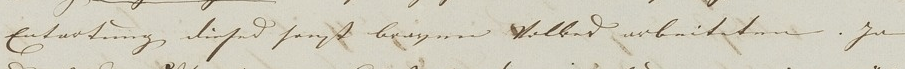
Entartung dieses sonst braven Volkes arbeiteten. Ja
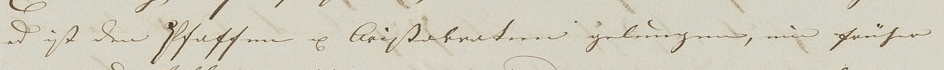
es ist den Pfaffen & Aristokraten gelungen, ein früher
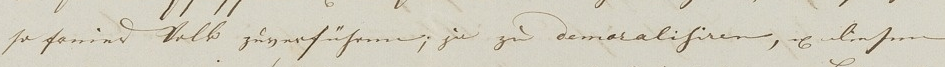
so freies Volk zuverführen; ja zu demoralisiren, & diesen
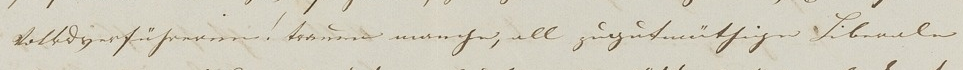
Volksverführeren! trauen manche, all zugutmüthige Liberale
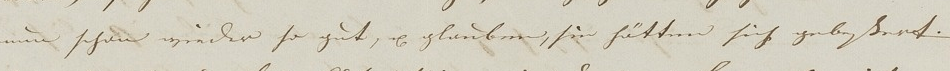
nun schon wieder so gut, & glauben, sie hätten sich gebeßert.
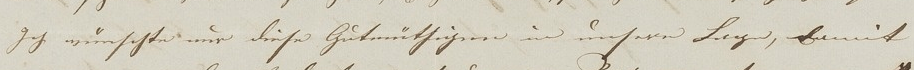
Ich wünschte nur diese Gutmüthigen in unsere Lage, damit
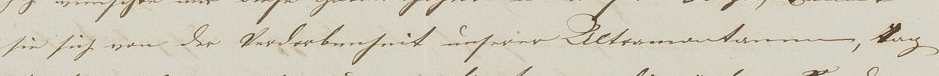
sie sich von der Verdorbenheit unserer Ultramontanen, Tag
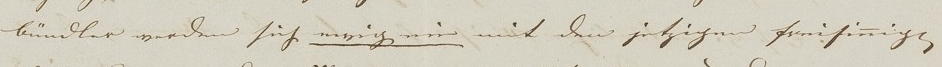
bündler werden sich ewig nie mit den jetzigen freisinnigen
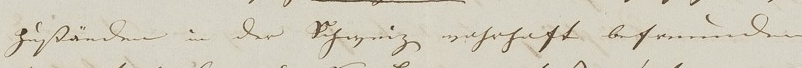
Zuständen in der Schweiz wahrhaft befreunden. –
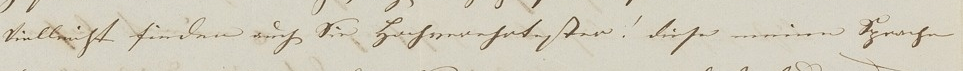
Vielleicht finden auch Sie Hochverehrtester! diese meine Sprache
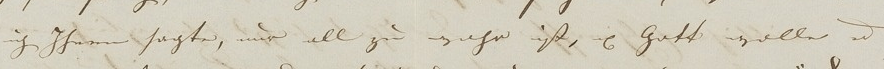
ich Ihnen sagte, nur all zu wahr ist, & Gott wolle es
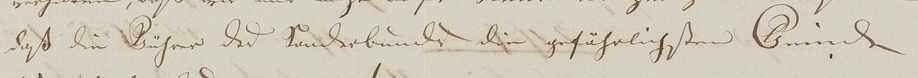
daß die Führer des Sonderbunds die gefährlichsten Feinde
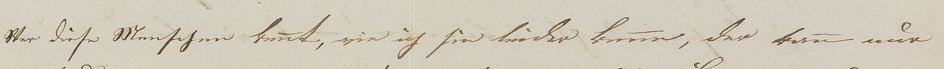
Wer diese Menschen kennt, wie ich sie leider kenne, der kann nur
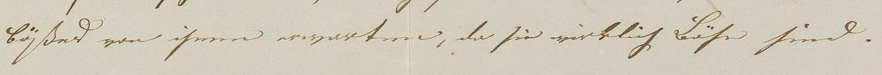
bößes von ihnen erwarten, da sie wirklich Böse sind. –
